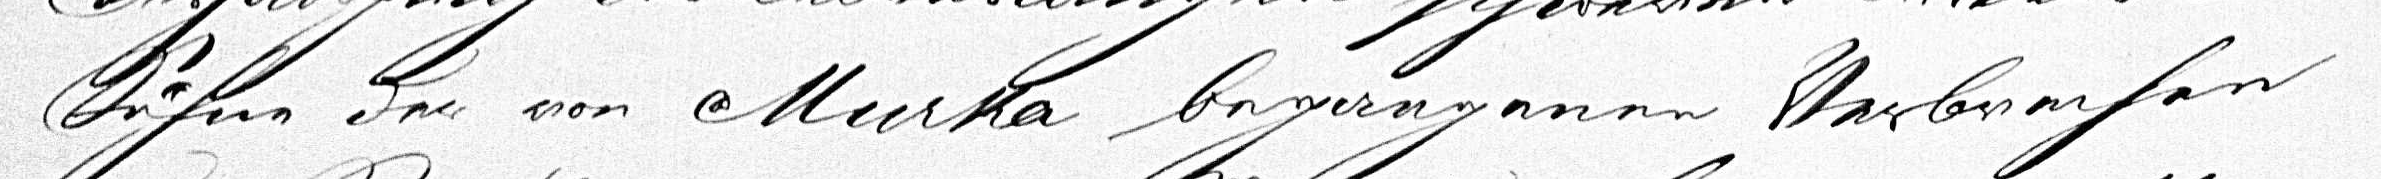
Sühne der von Murka begangenen Verbrechen
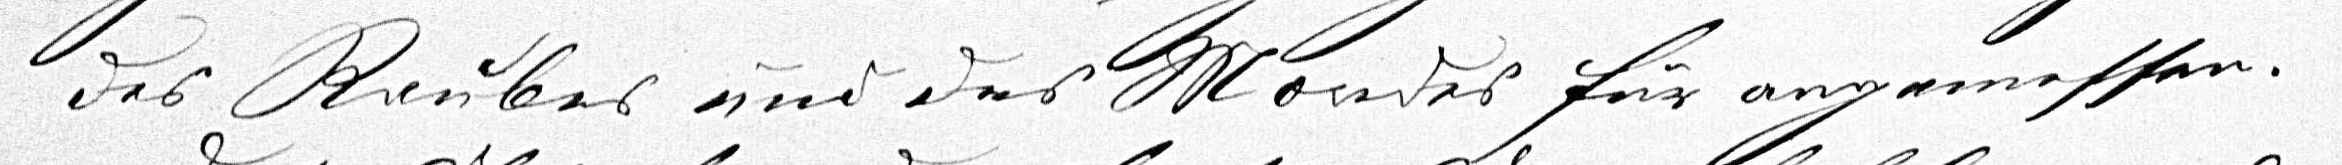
des Raubes und des Mordes für angemessen.
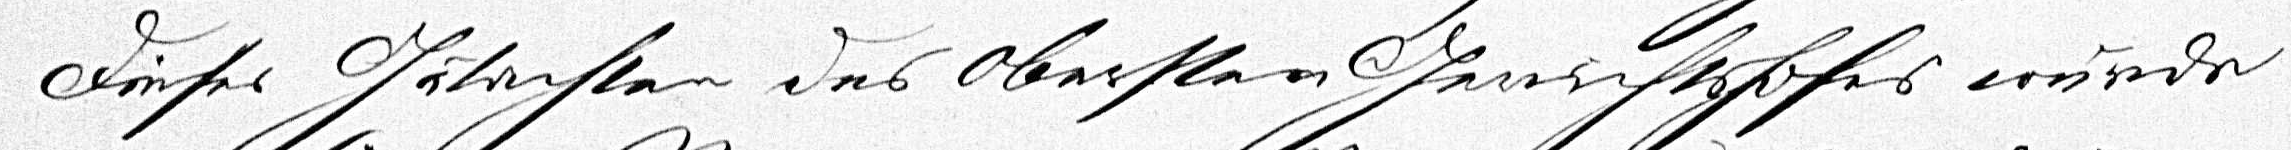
Dieser Gutachten des Obersten Gerichtshofes wurde
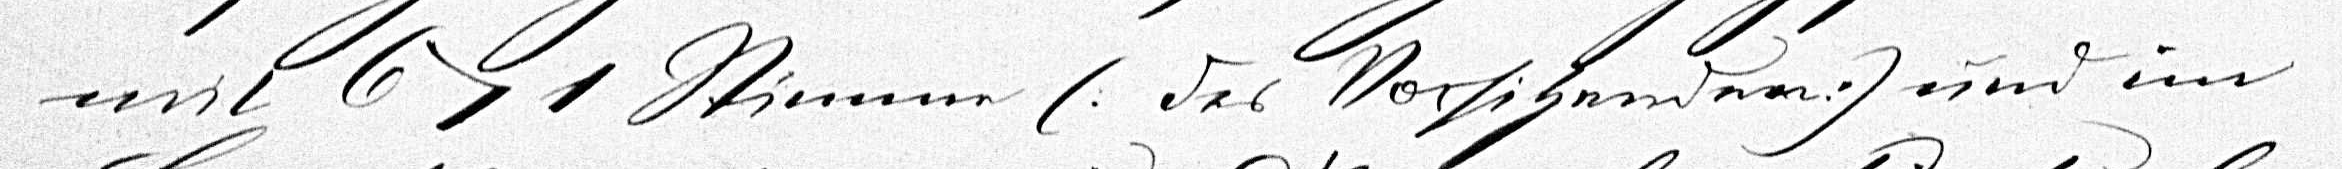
mit 6>1 Stimme (das Vorsitzenden) und im
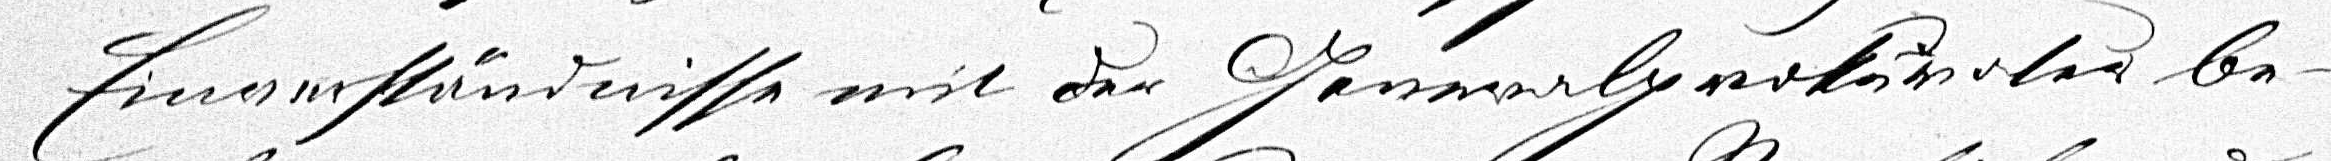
Einverständnisse mit der Generalprokuratur be¬
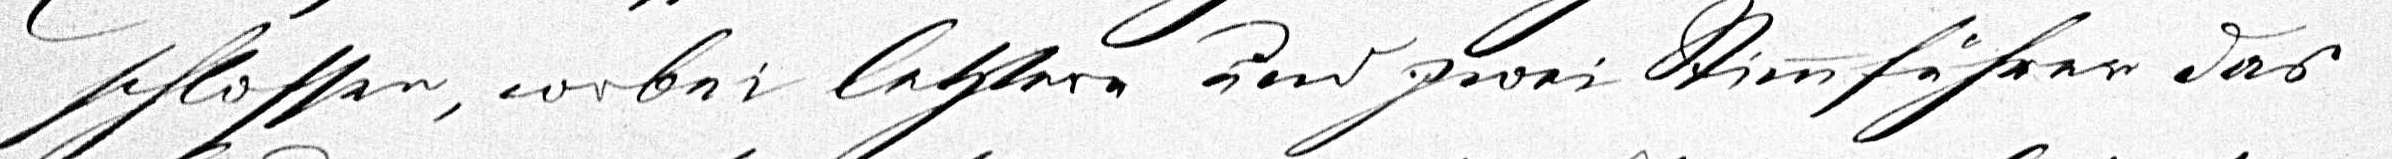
schlossen, wobei letztere und zwei Stimmführer das
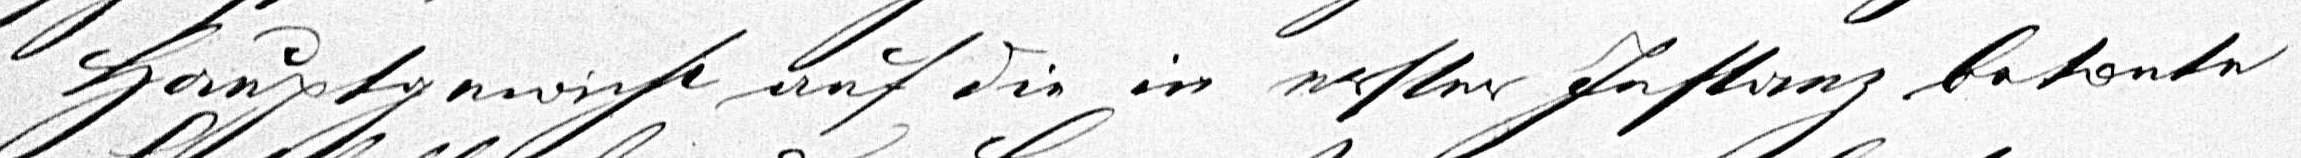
Hauptgericht auf die in erster Instanz betonte
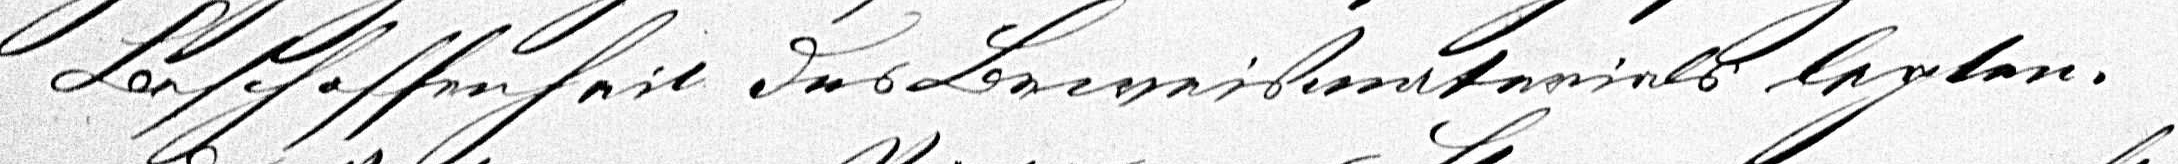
Beschaffenheit des Beweismaterials legten.
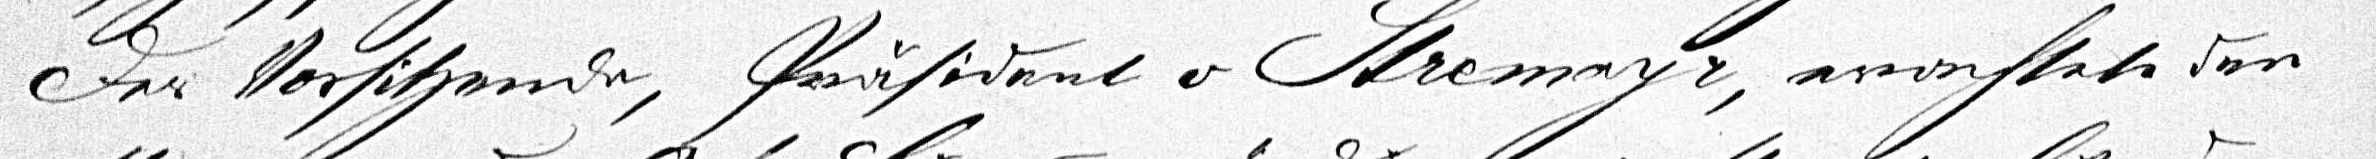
Der Vorsitzende, Präsident v. Stremayr, erachtet den
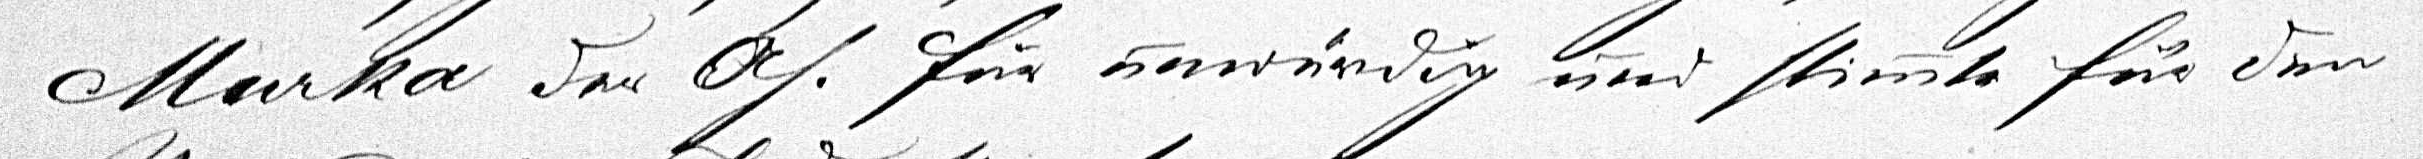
Murka der Ah. für unwürdig und simmte für den
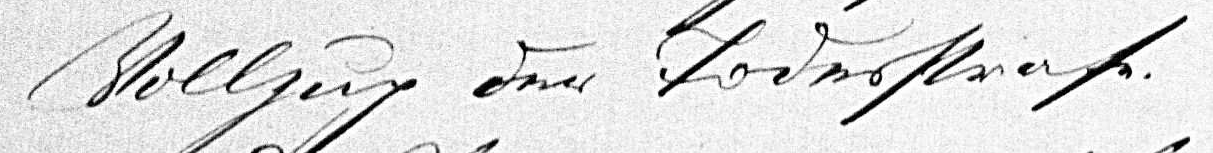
Vollzug der Todesstrafe.
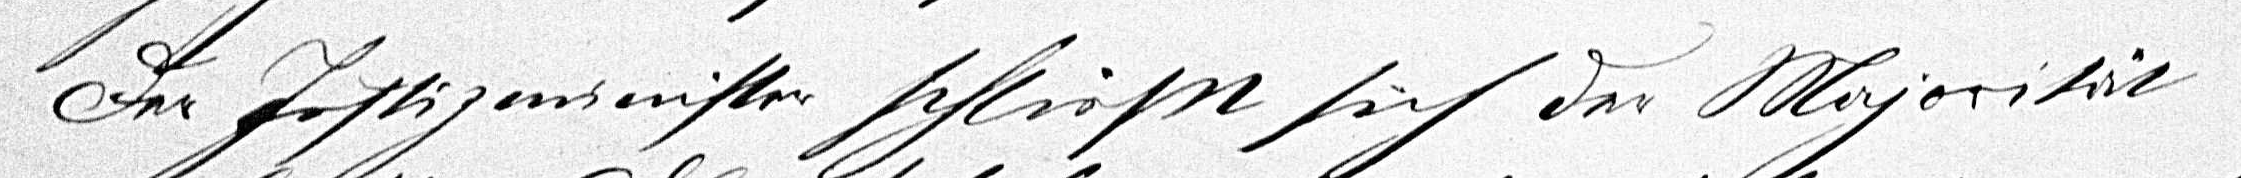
Der Justizminister schließt sich der Majorität
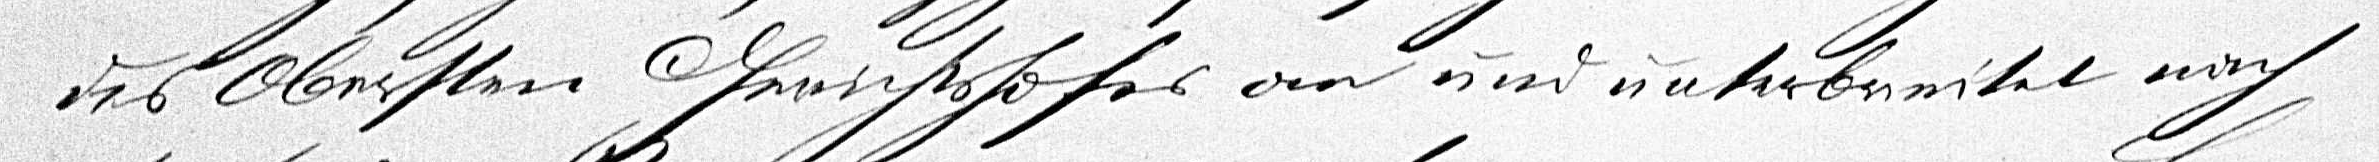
des Obersten Gerichtshofes an und unterbreitet nach¬
